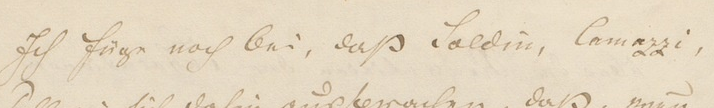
Ich füge noch bei, daß Soldin, Camazzi,
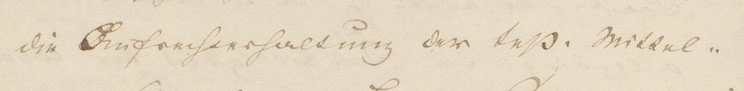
die Aufrechterhaltung der teß. Mittel-
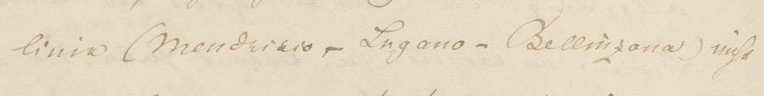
linie (Mendrisio–Lugano–Bellinzona) nicht
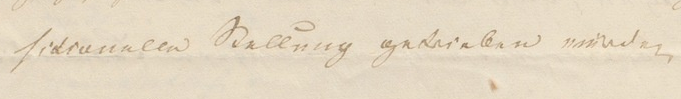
sitionelle Stellung getrieben würden. –
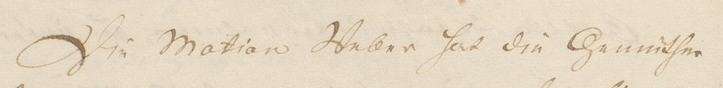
Die Motion Weber hat die Gemüther
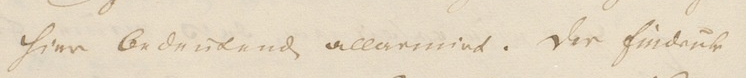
hier bedeutend allarmirt. Der Eindruk
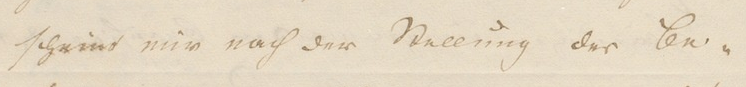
scheint mir nach der Stellung des Be-
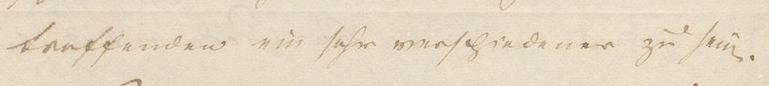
treffenden ein sehr verschiedener zu sein.
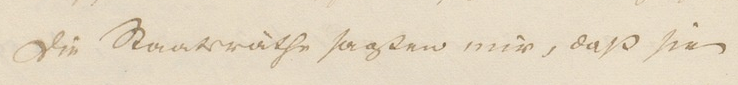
Die Staatsräthe sagten mir, daß sie
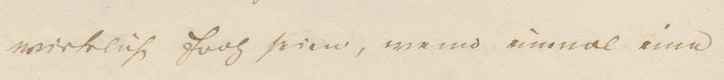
wirklich froh seien, wenn einmal eine
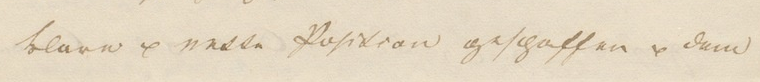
klare & nette Position geschaffen & dem
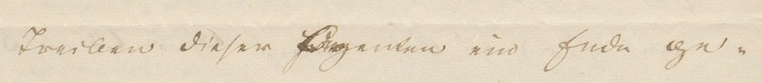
Treiben dieser Agenten ein Ende ge-
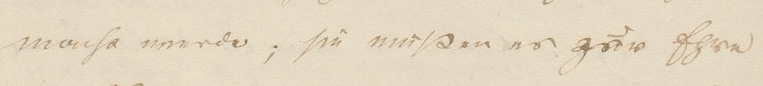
macht werde; sie müßen es zur Ehre
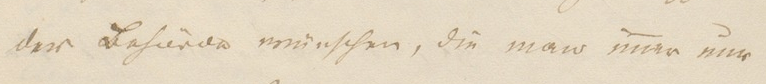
der Behörde wünschen, die man immer nur
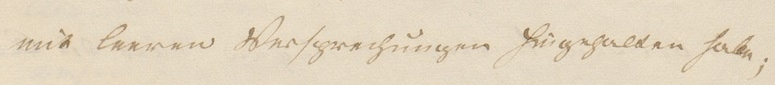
mit leeren Versprechungen hingehalten habe;
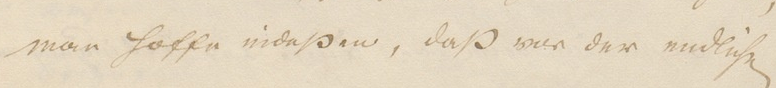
man hoffe indeßen, daß vor der endlichen
